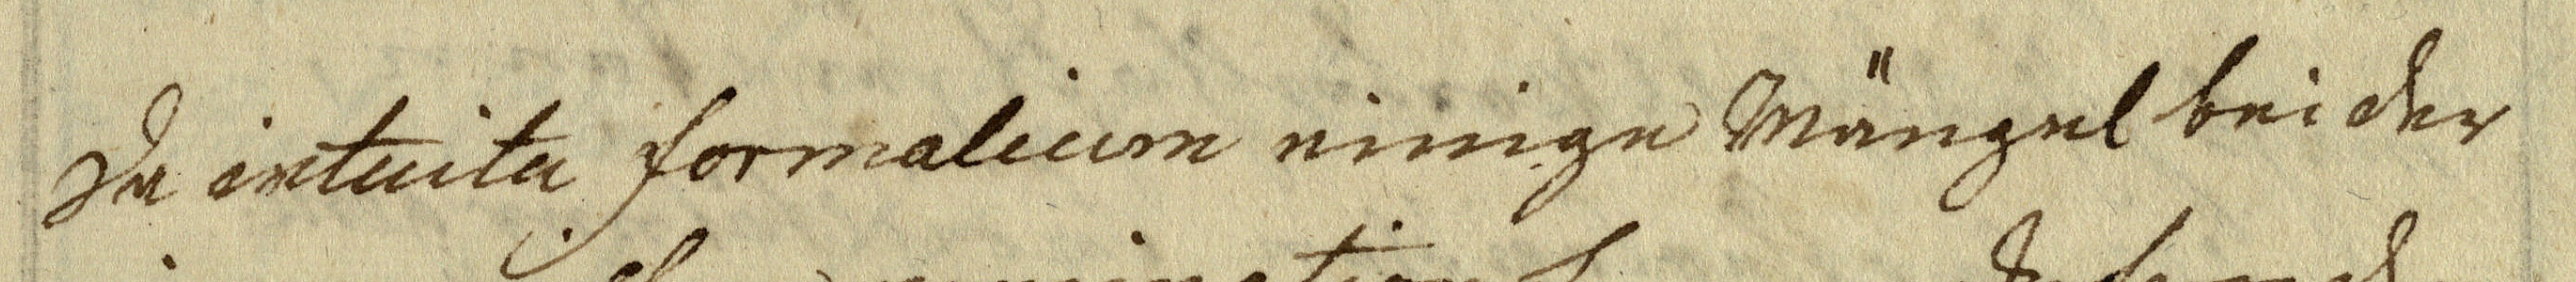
Da intuiata formalium einige Mängel bei der
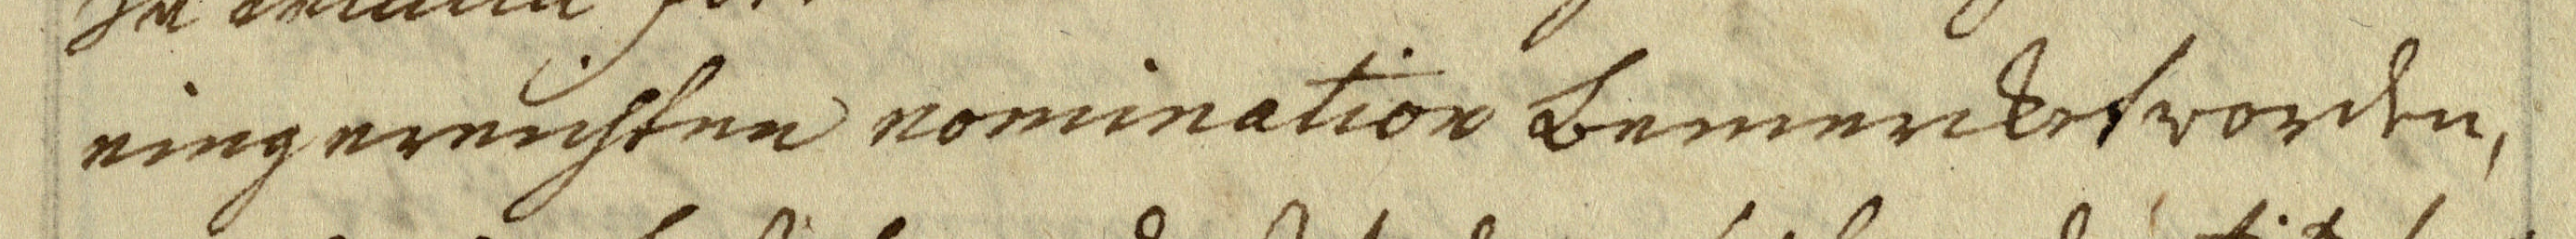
eingereichten nomination bemercket worden,
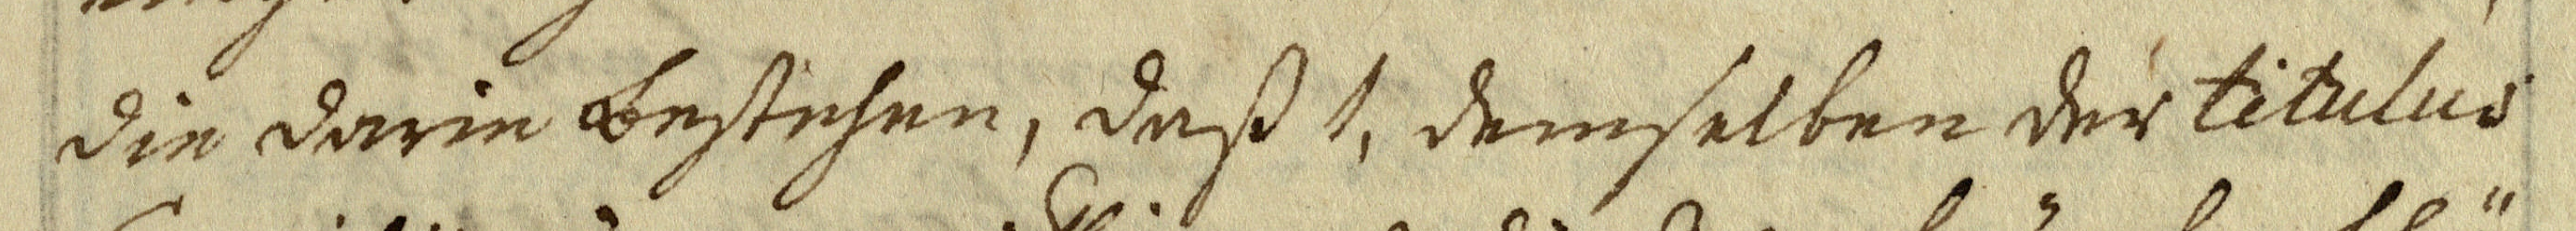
die darin bestehen, daß 1, demselben der titulus
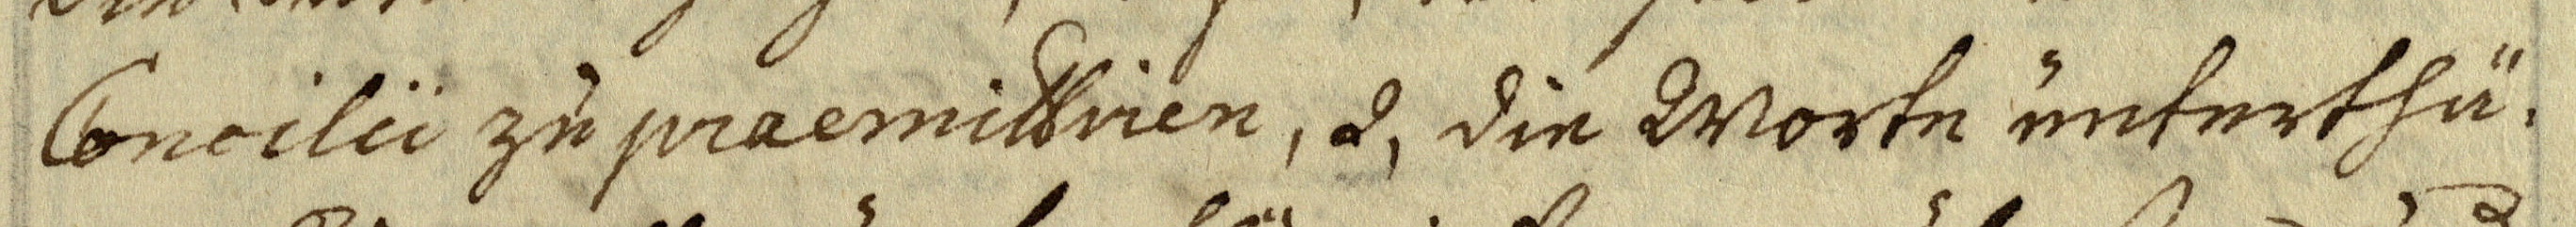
Concilii zu praemittiren, 2, die Worte unterthä¬
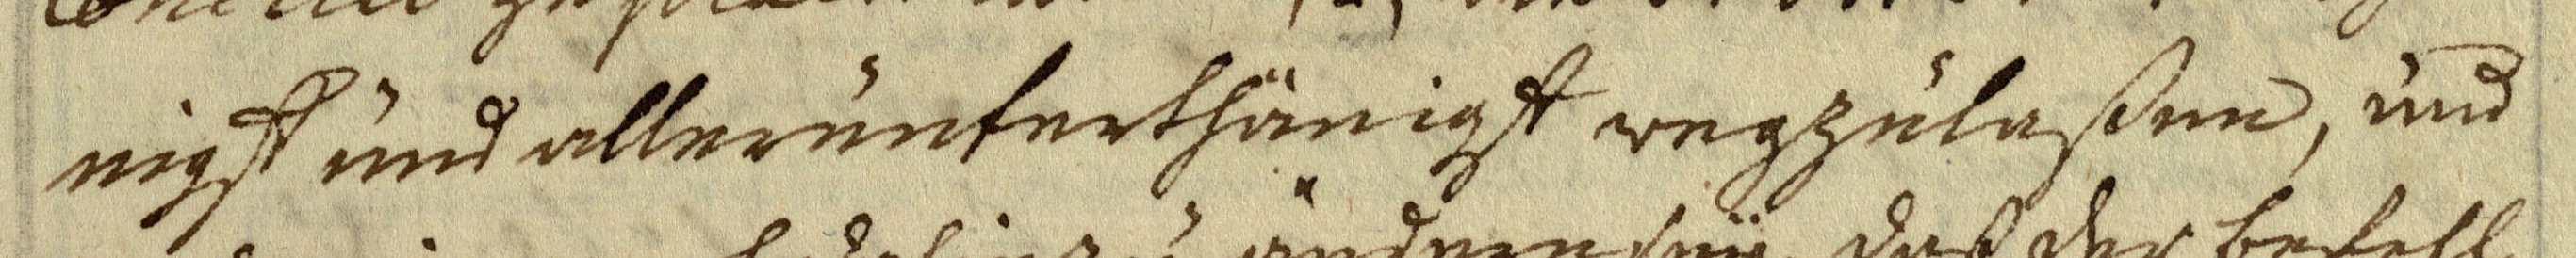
nigst und allerunterthänigst wegzulaßen, und
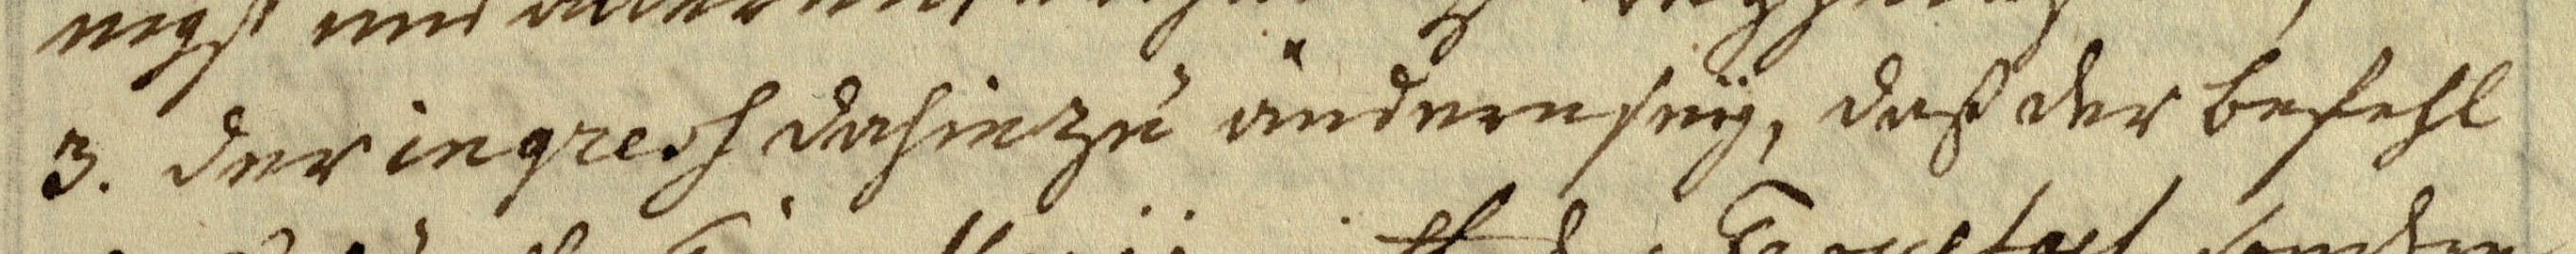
3. der ingress dahin zu ändern seÿ, daß der Befehl
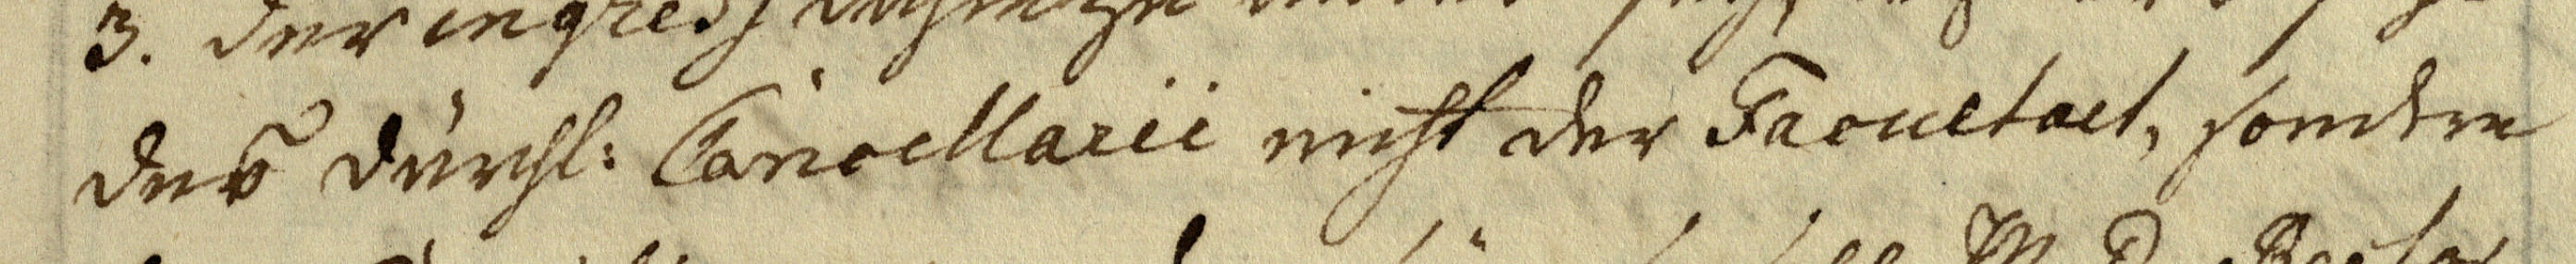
des Durchl. Cancellarii nicht der Facultaet, sondern
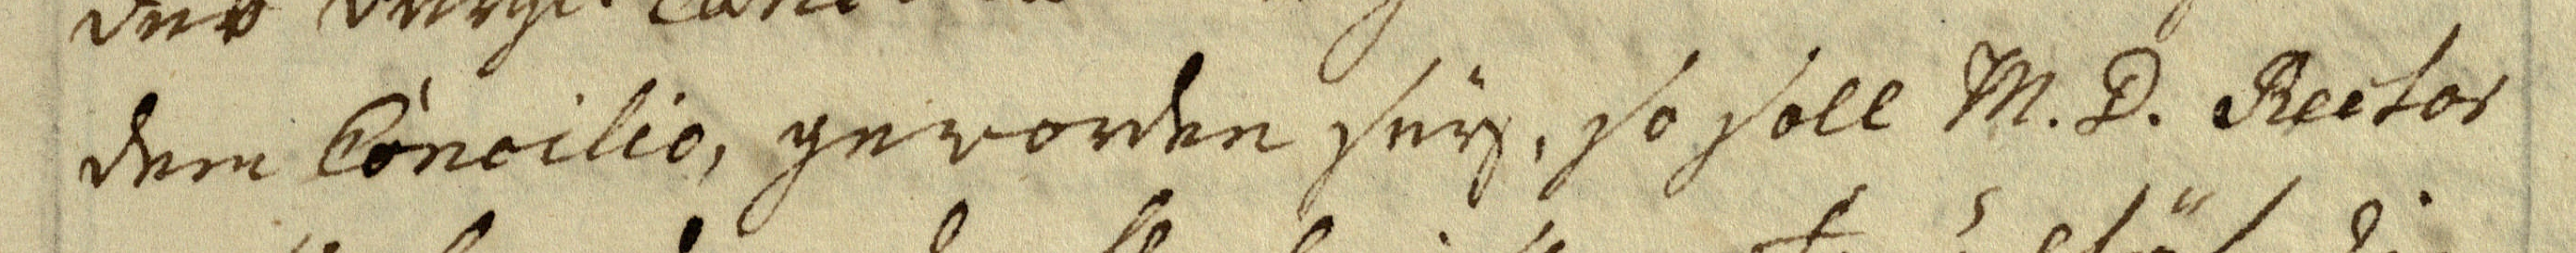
dem Concilio, geworden seÿ, so soll M. D. Rector
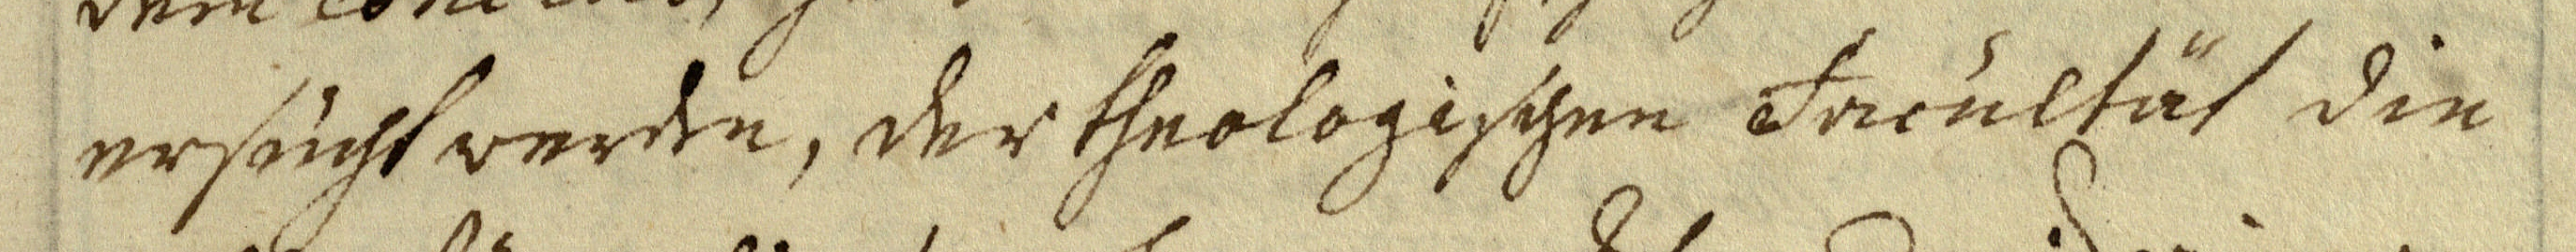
ersucht werden, der theologischen Facultät die
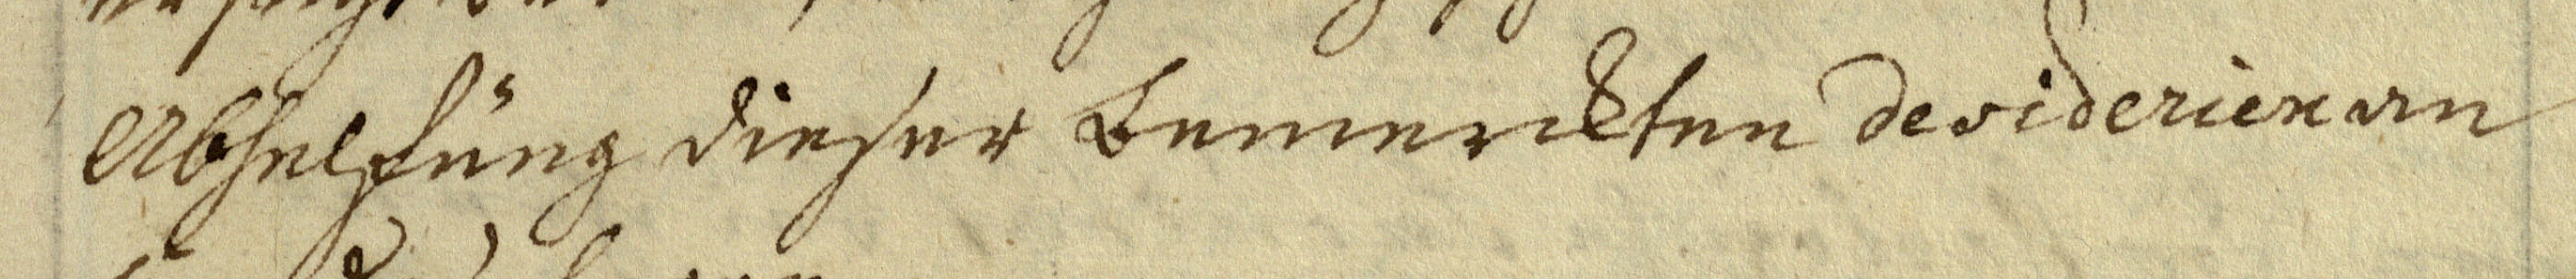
Abhelfung dieser bemerckten desiderien an
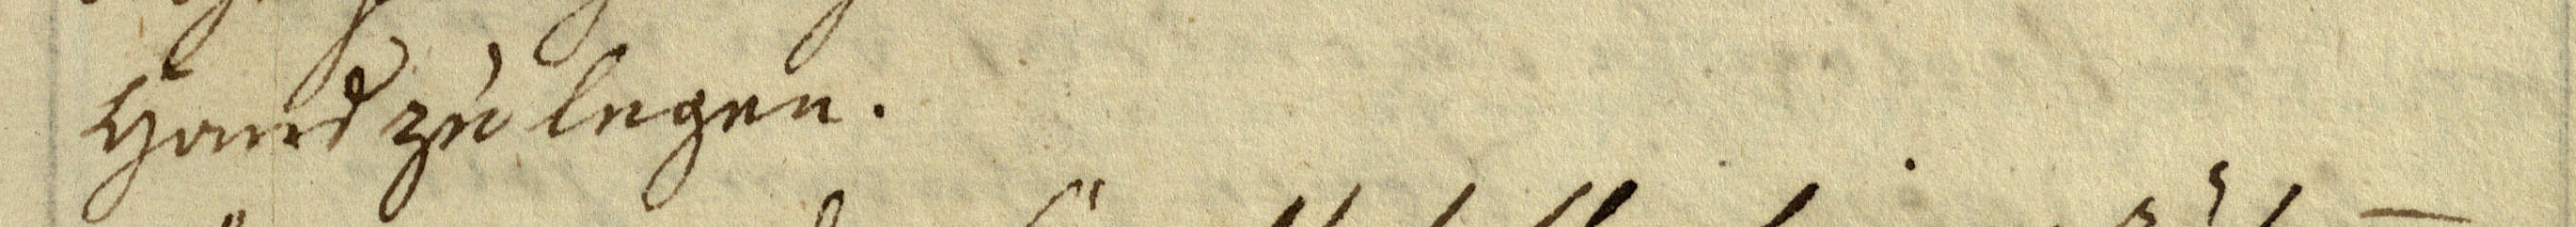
Hand zu legen.
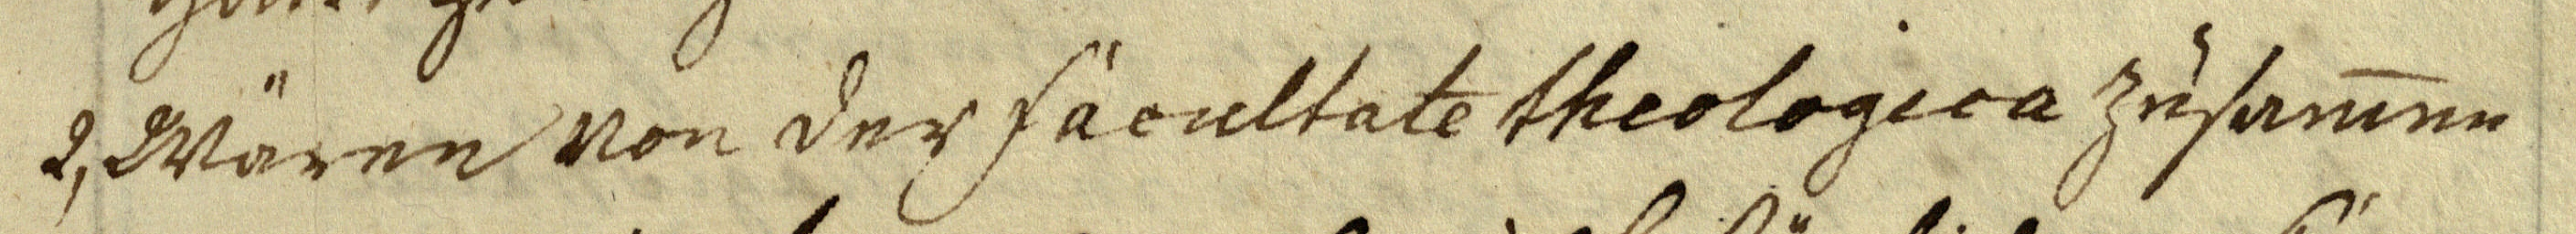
2, Wären von der Facultate theologica zusamen
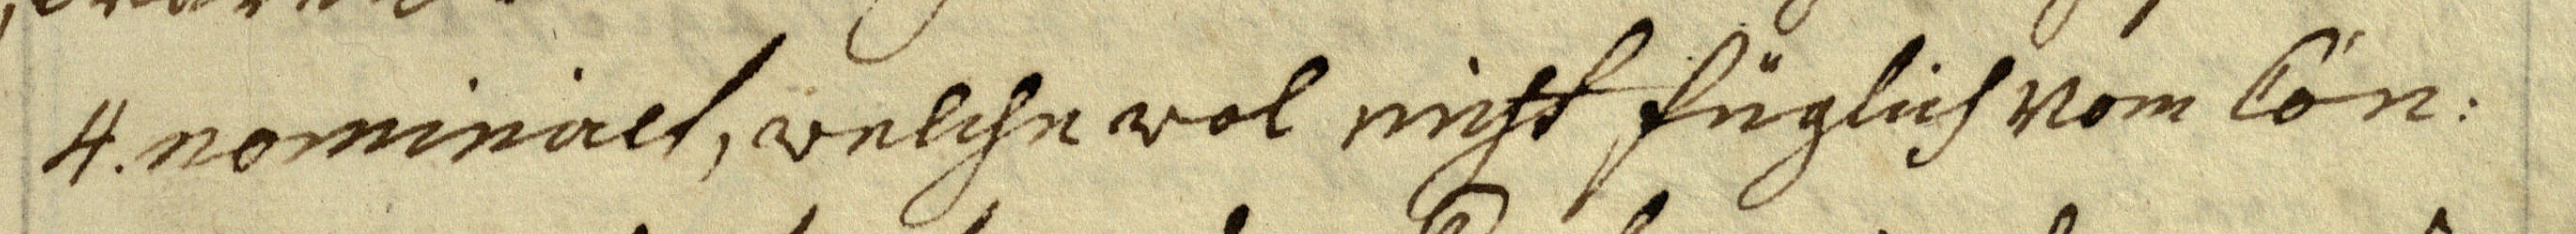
4 nominiret, welche wol nicht füglich vom Con¬
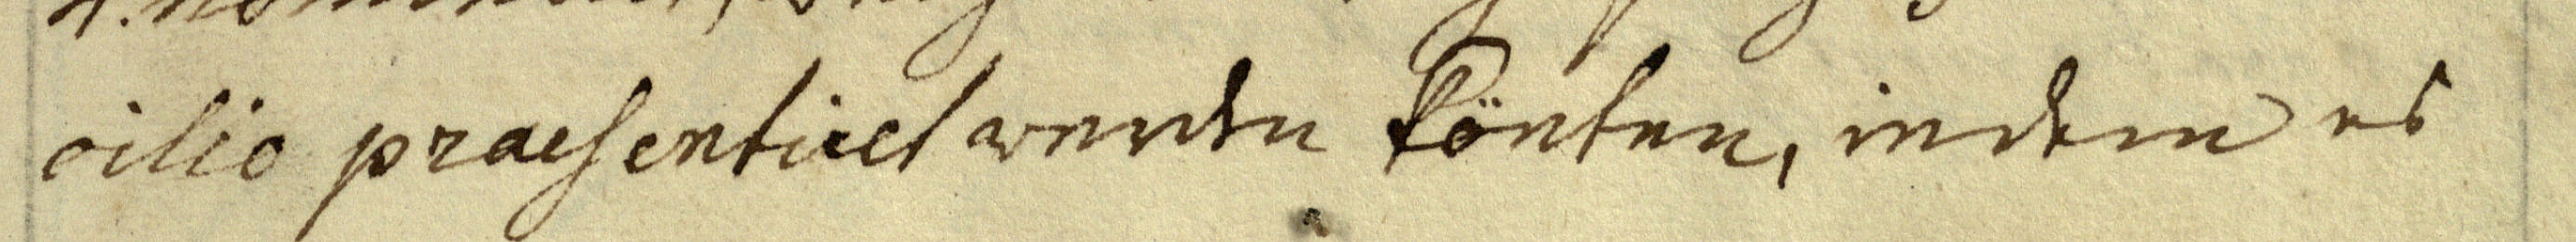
cilio praesentiret werden könten, indem es
